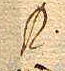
R.
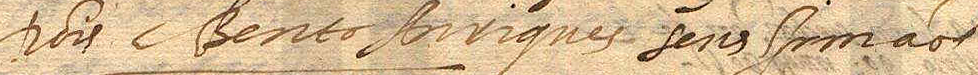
Roīs E Bento Anriques seus Jrmaõs
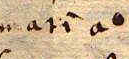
matī ao
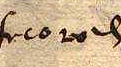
frco rois
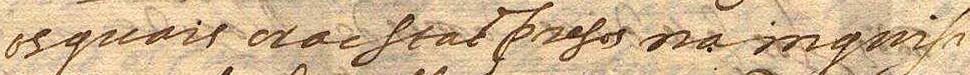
os quais ora estaõ presos na inquisi
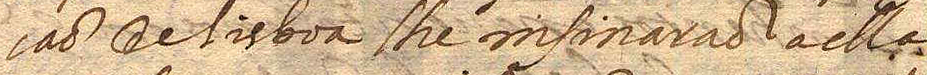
çaõ de lisboa lhe insinaraõ a ella
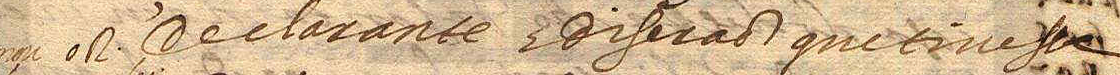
declarante E diseraõ que tiuesse
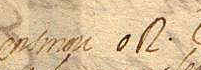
ensinou o R.
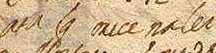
a ta q̄ crece na lei
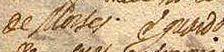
de Moizes e guarda
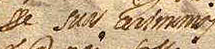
sse suas cerimonias
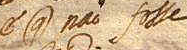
e q̄ naõ fosse
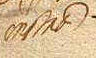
cristão
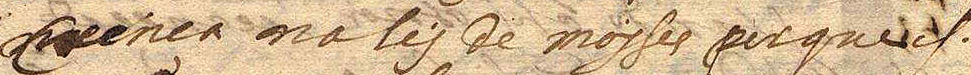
Crença na lej de moyses porque es
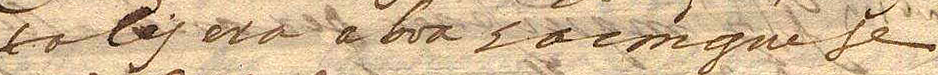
ta lej era a boa E a em que se
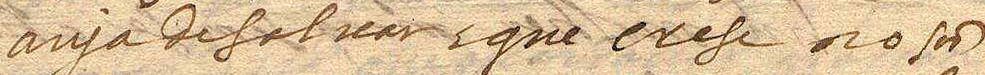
auja de saluar e que crese no sor̄
